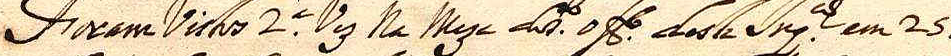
Foram Vistos 2.a Vez Na Meza do s.to off.o desta Inq.caõ em 25.
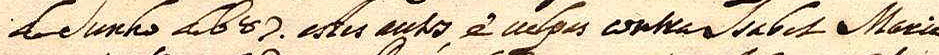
de Iunho de 687 estes autos, e culpas contra Isabel Maria
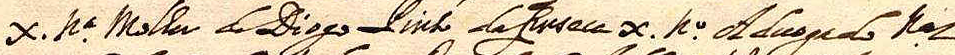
x. n.a Molher de Diogo Pinto da fonseca x. n.o Aduogado N.al
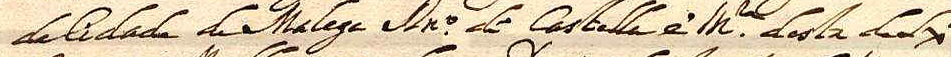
da Cidade de Malega Rn.o de Castella e M.ra desta de Lx.a
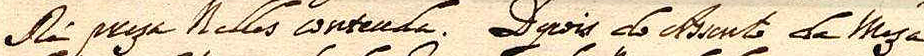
Ré preza Nelles conteuda. Depois do Assento da Meza
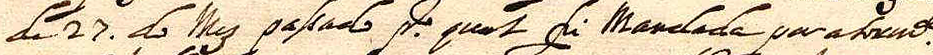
de 27. do Mez passado p.lo qual foi Mandada por a torm.to
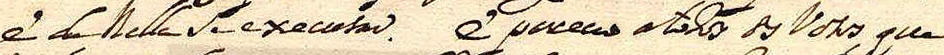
e de Nella se executar. e pareceo a todos os Votos, que
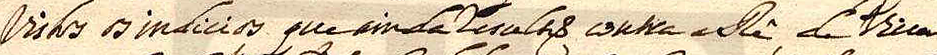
Vistos os indicios que ainda reuelaõ contra a Ré de Viuer
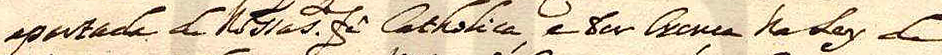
apartada de Nossa s.ta fé Catholica, e ter Crença Na Ley de
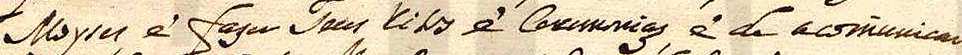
Moyses, e fazer seus ritos e ceremoniaz, e de a com̄unicar
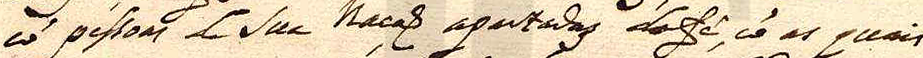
cō pessoas de sua Naçaõ apartadaz da fé, cō as quais
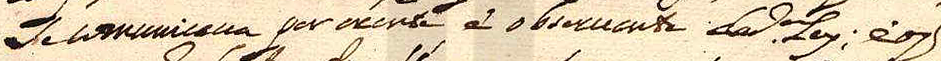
se comunicaua por crente e obseruante da d.a Ley; e o q̄
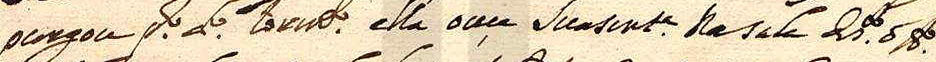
purgou p.lo d.o torm.to ella ouça sua sent.a Na sala do s.to off.o
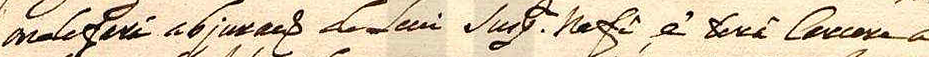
onde fará abjuraçaõ de Leui susp.ta na fé, e terá Carcere a
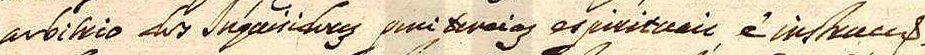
arbitrio dos Inquisidorez penitenciaz espirituais, e instruçaõ
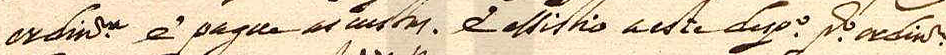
ordin.ra e pague as custas. e assistio a este desp.o p.lo ordinro.
